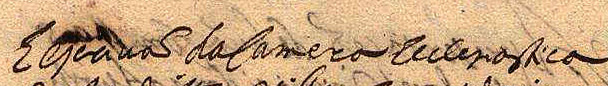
E escriuaõ da Camera Ecclesiastica
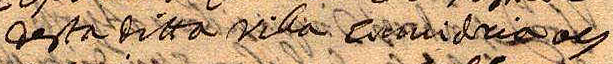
desta ditta villa E ouuidoria o es
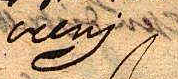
creuj
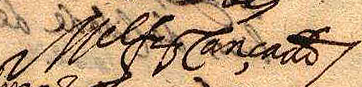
Mel frz̄ Cançado
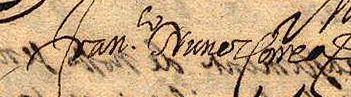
Fran.co Nunez Correa
